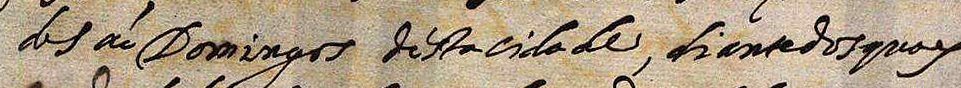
de Saõ Domingos desta cidade, diante dos quaes
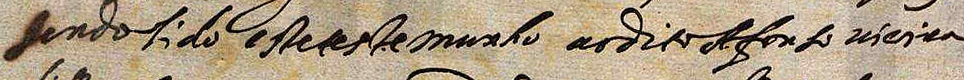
sendo lido este testemunho ao dito Afonso uieira
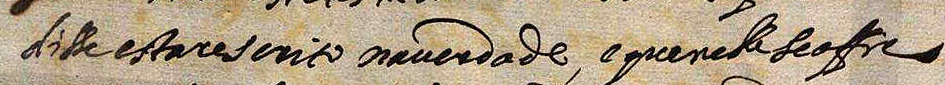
disse estar escrito na uerdade, e que nelle se affir
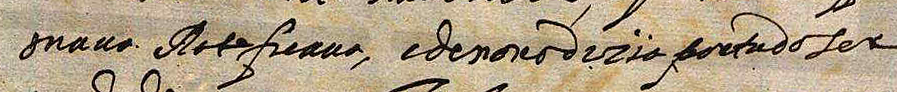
maua Rateficaua, e de nouo dizia por tudo ser
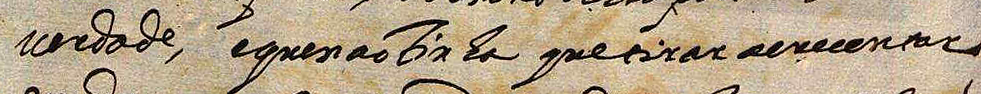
uerdade, e que naõ tinha que tirar acrecentar
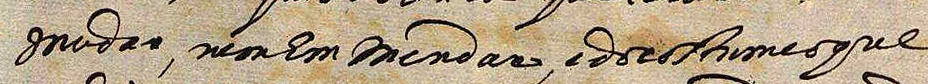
mudar, nem Emmendar, e do costume o que
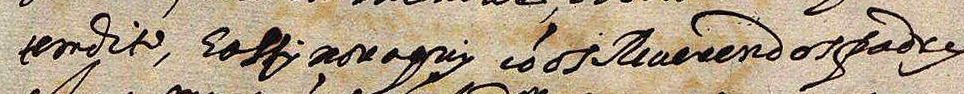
tem dito, E assynou aquy cō os Reuerendos padres
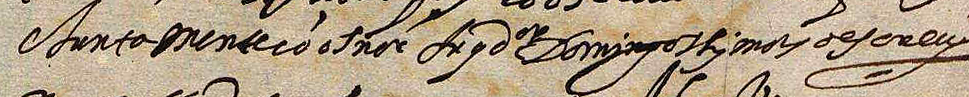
e Iuntamente cō o snor̄ Jnqdor Domingos symois o escreuj
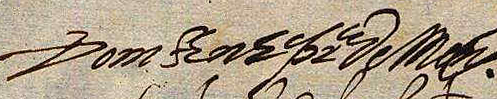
Dom Anto pra de Men̄s.
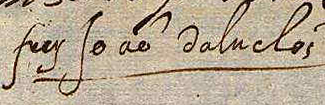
frey João daluelos
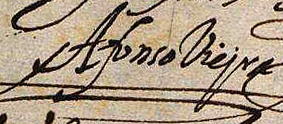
Afonso Viejra
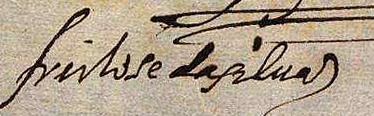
frei Iose da silua
